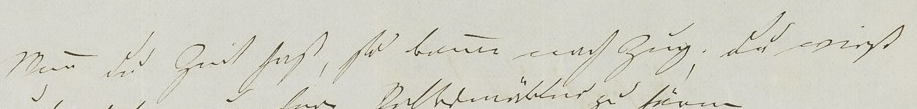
Wenn du Zeit hast, so komme nach Zug; Du wirst
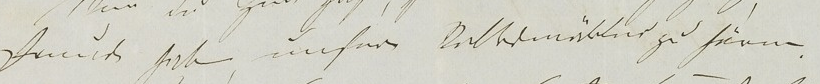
Freude haben, unsere Volksmäkler zu hören.
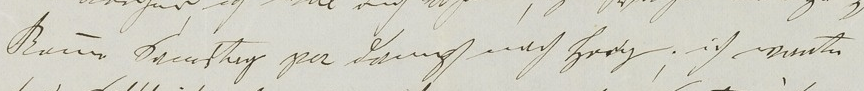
Komme Samstag per Dampf nach Horgen; ich warte
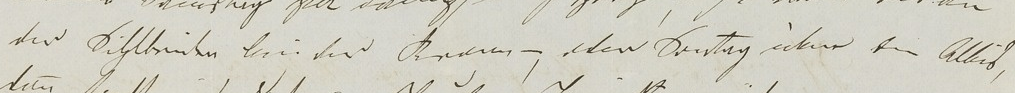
der Sihlbrüke bei der Krone, oder Sonntag über den Albis,
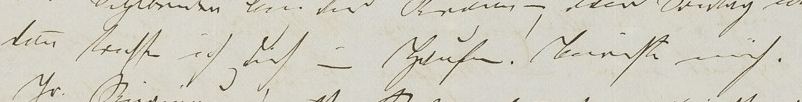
dann treffe ich Dich in Hausen. Berichte mich.
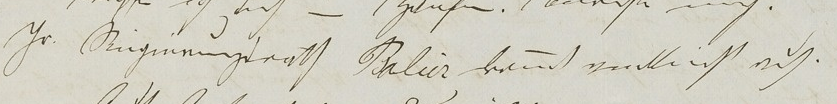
Hr. Regierungsrath Bolier kommt vielleicht auch.
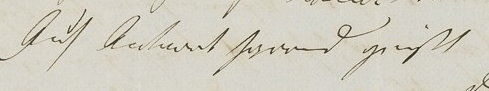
Auf Antwort harrend grüßt
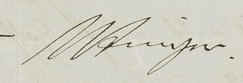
Utinger.
